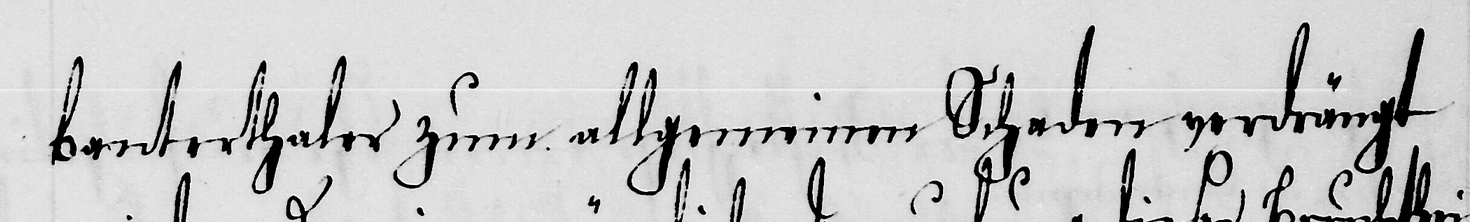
banterthaler zum allgemeinen Schaden verdrängt
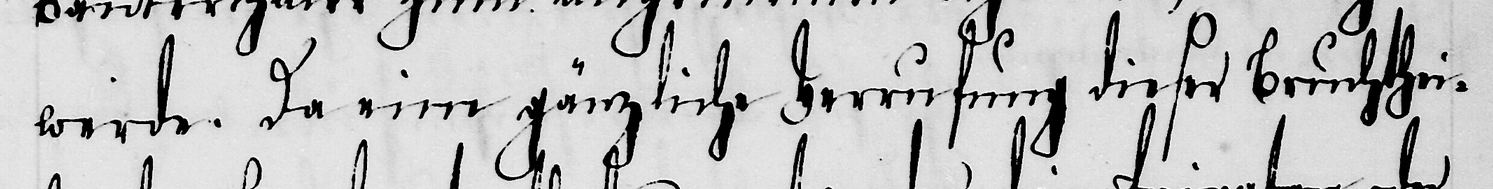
werde. Da eine gänzliche Verrufung dieser Bruchthei¬
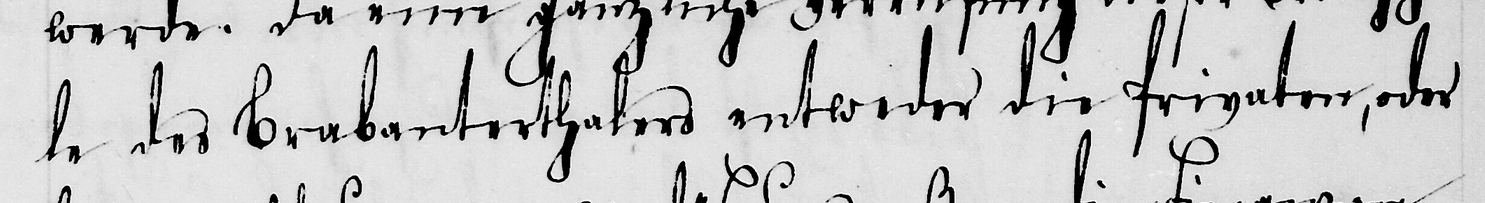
le des Brabanterthalers entweder die Privaten, oder
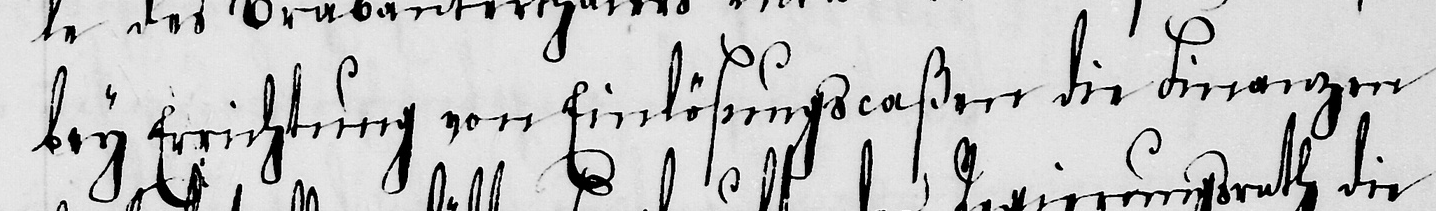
bey Errichtung von Einlösungscaßen die Finanzen
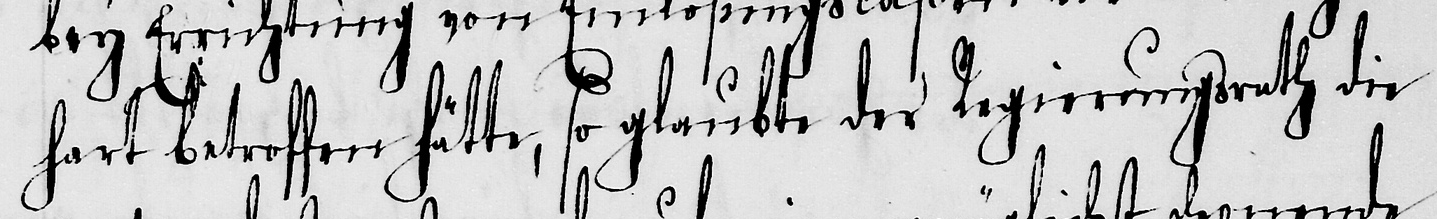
betroffen hätte, so glaubte der Regierungsrath die
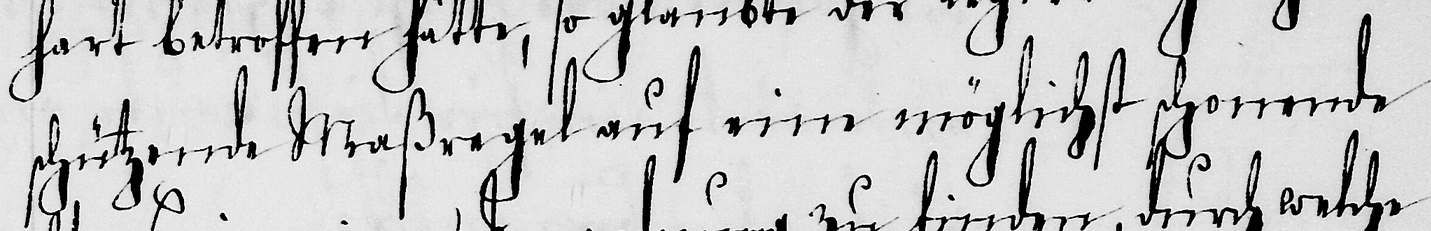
schützende Maßregel auf eine möglichst schonende
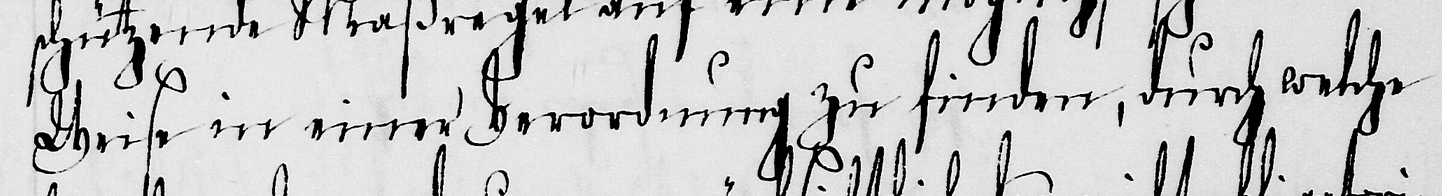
Weise in einer Verordnung zu finden, durch welche
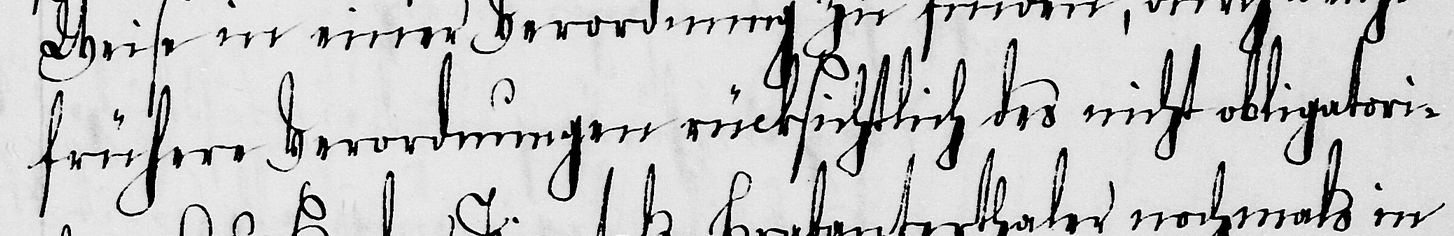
frühere Verordnungen rücksichtlich des nicht obligato¬
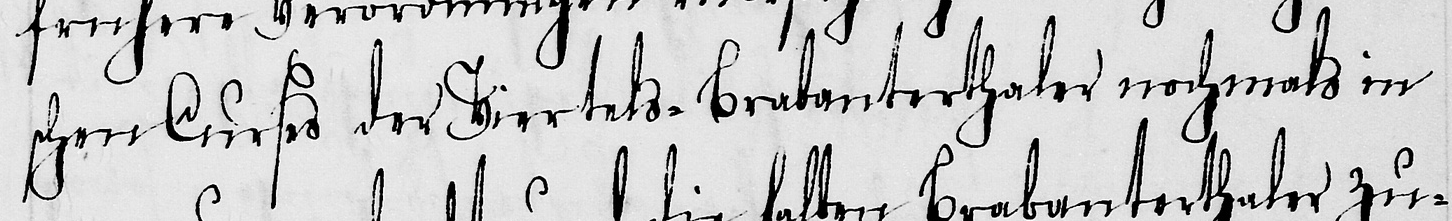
schen Curses der Viertels-Brabanterthaler nochmals in
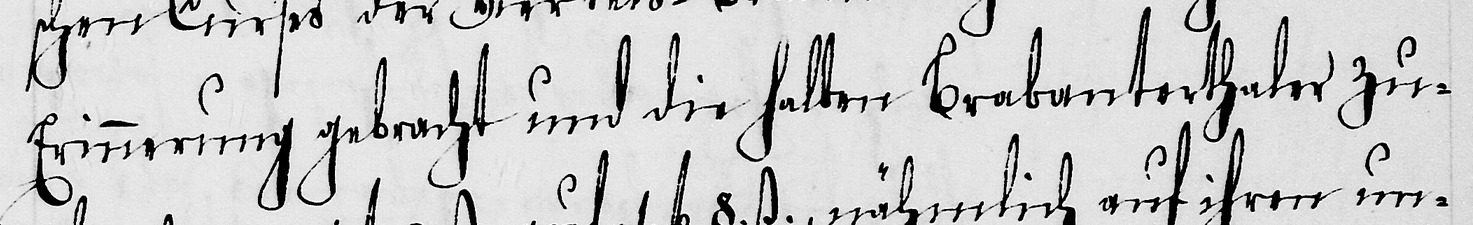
Erinnerung gebracht und die halben Brabanterthaler zu¬
